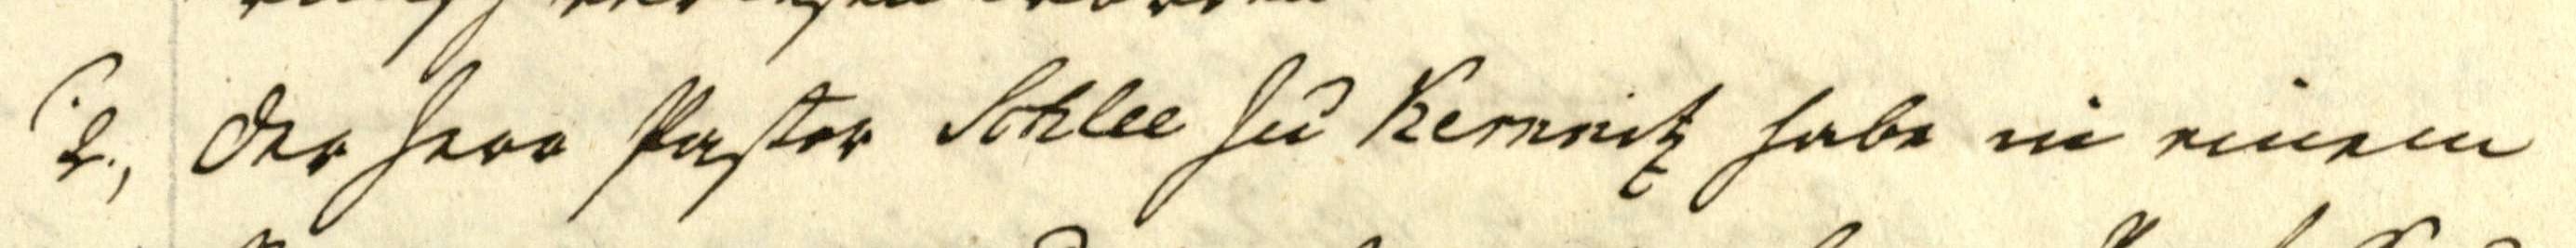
2., Der Herr Pastor Schlee zu Kemnitz habe in einem
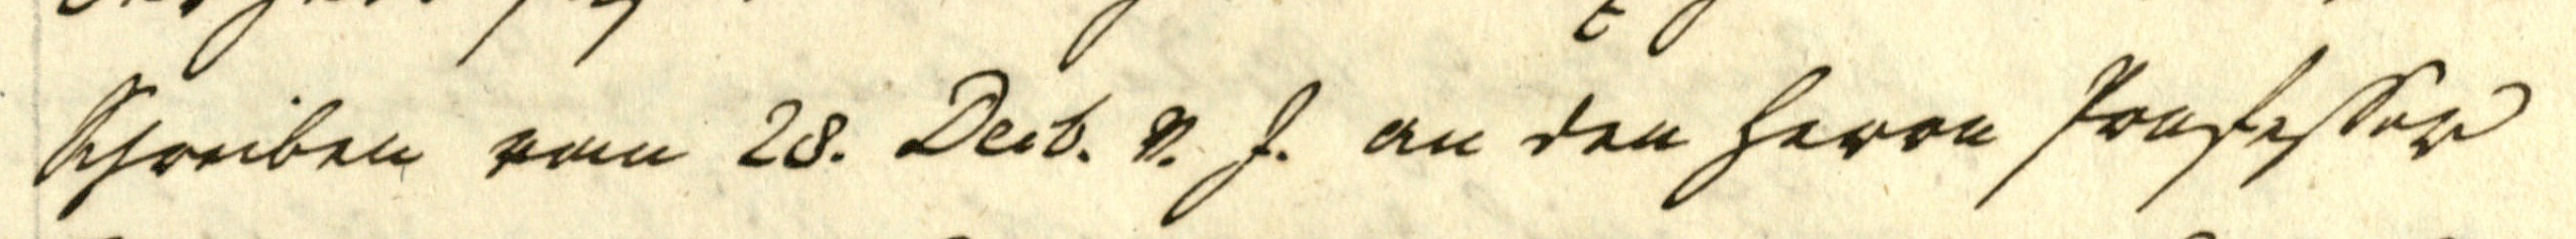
Schreiben vom 28. Decb. v. J. an den Herrn Professor
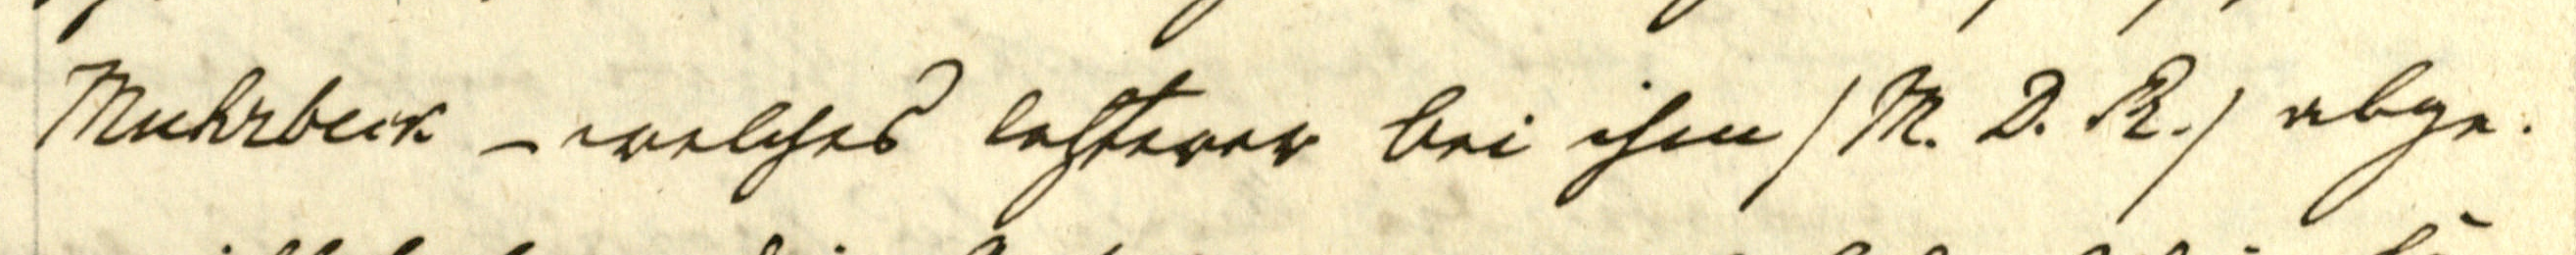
Muhrbeck - welches letzterer bei ihm /M. D. R./ abge¬
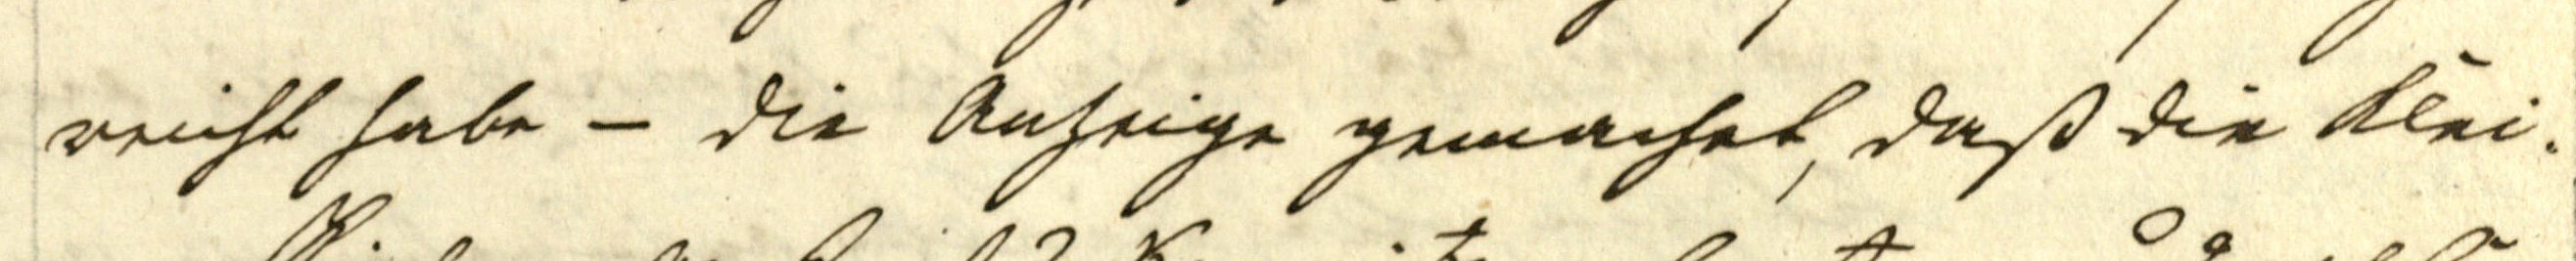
reicht habe - die Anzeige gemachet, daß die klei¬
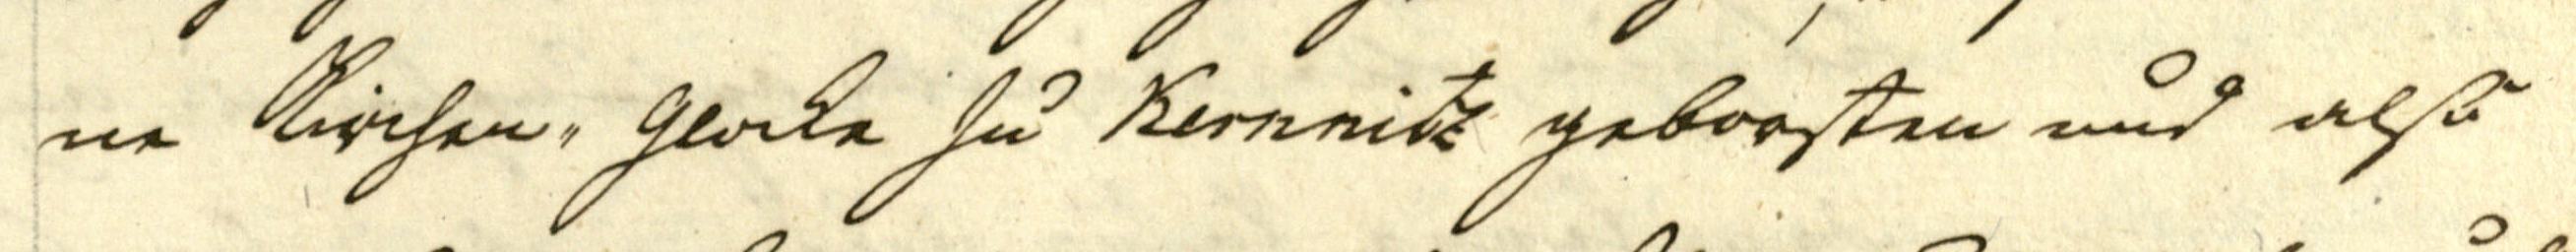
ne Kirchen Glocke zu Kemnitz geborsten und also
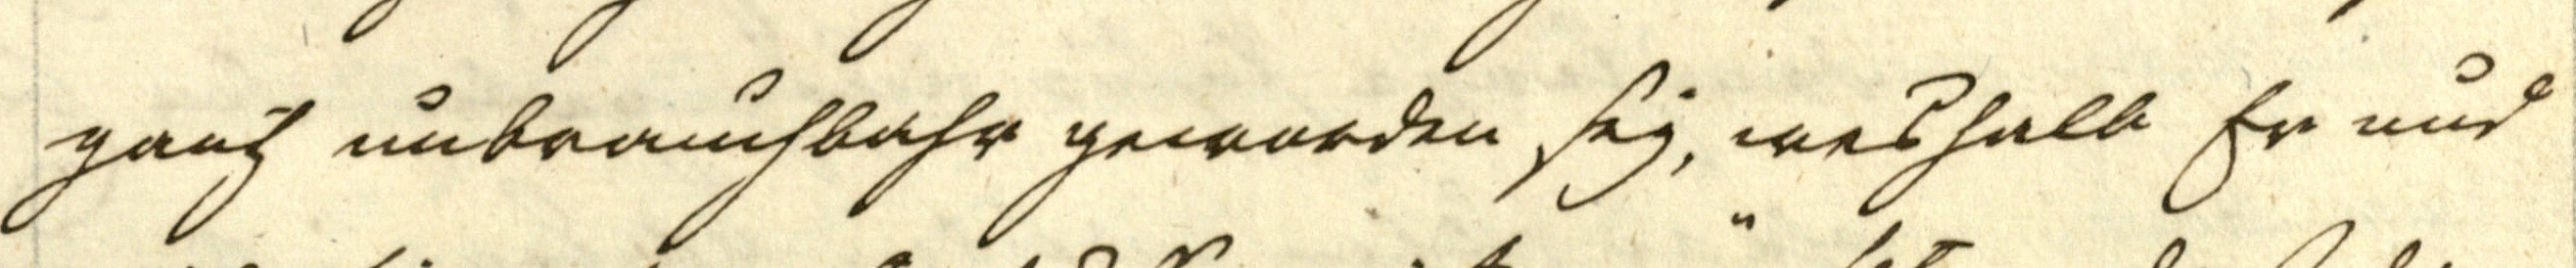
ganz unbrauchbahr geworden seÿ, weshalb Er und
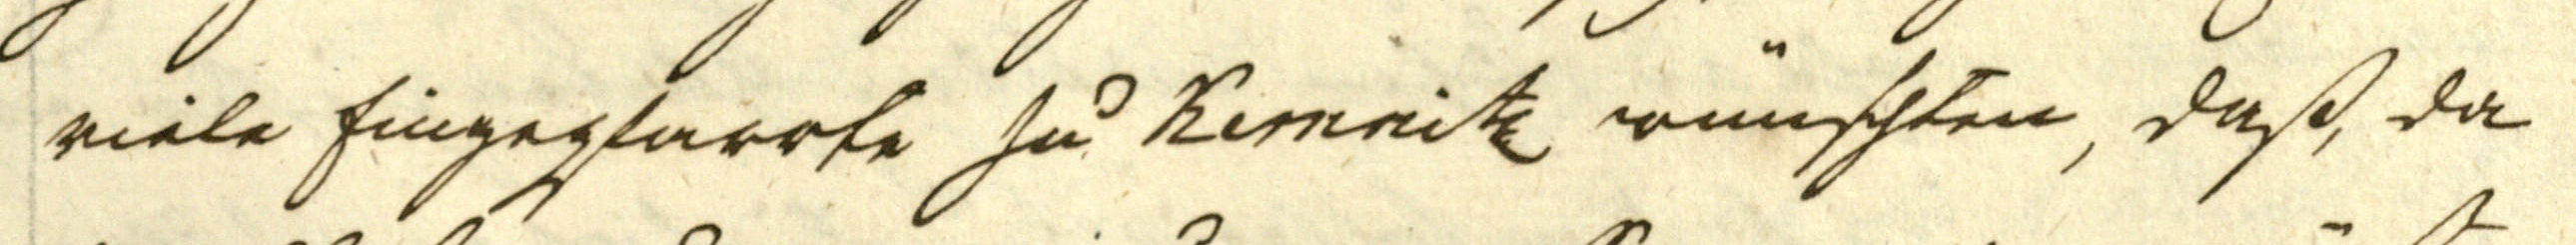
viele Eingepfarrte zu Kemnitz wünschten, daß, da
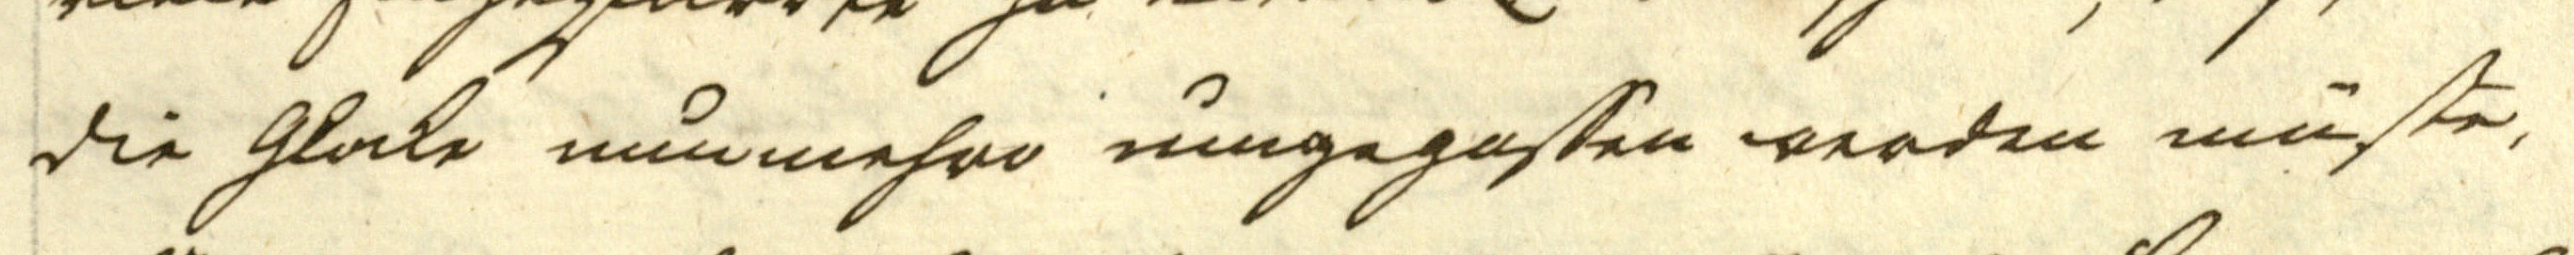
die Glocke nunmehro umgegossen werden müßte,
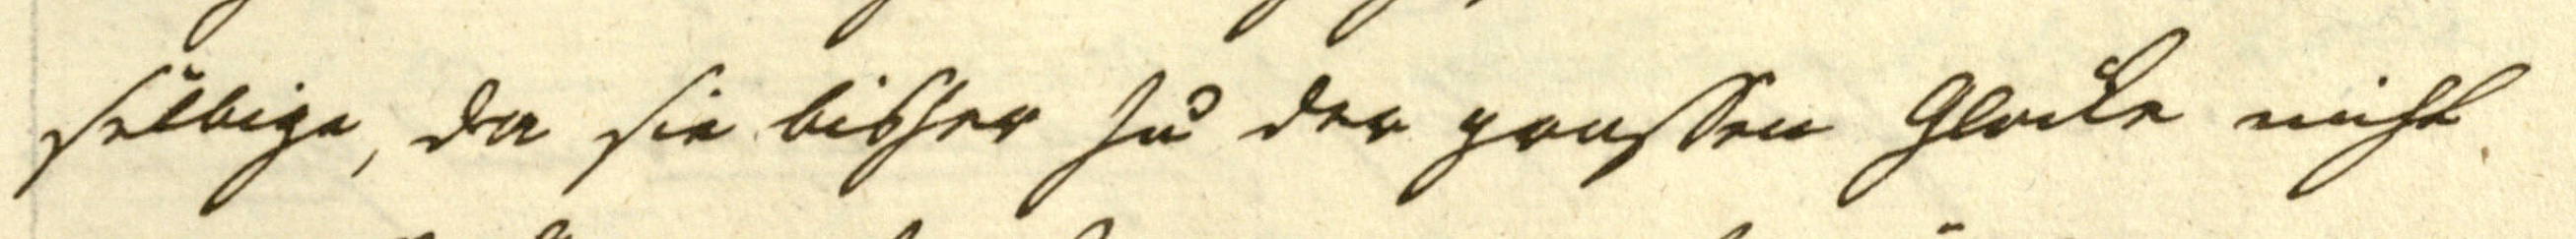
selbige, da sie bisher zu der grossen Glocke nicht
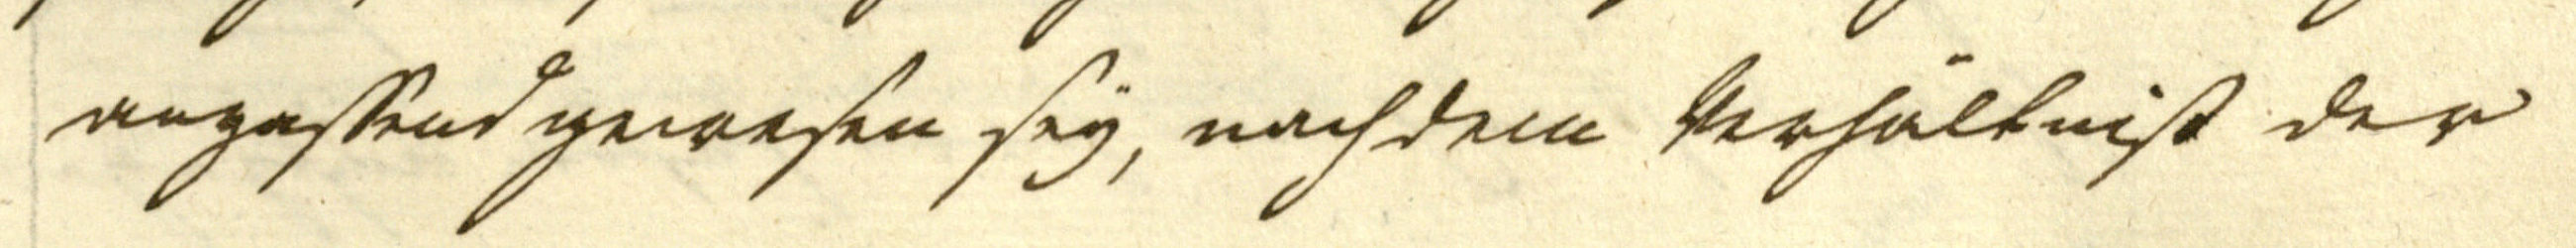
anpassend gewesen seÿ, nach dem Verhältniß der
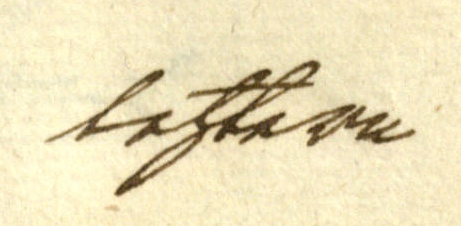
letztern
